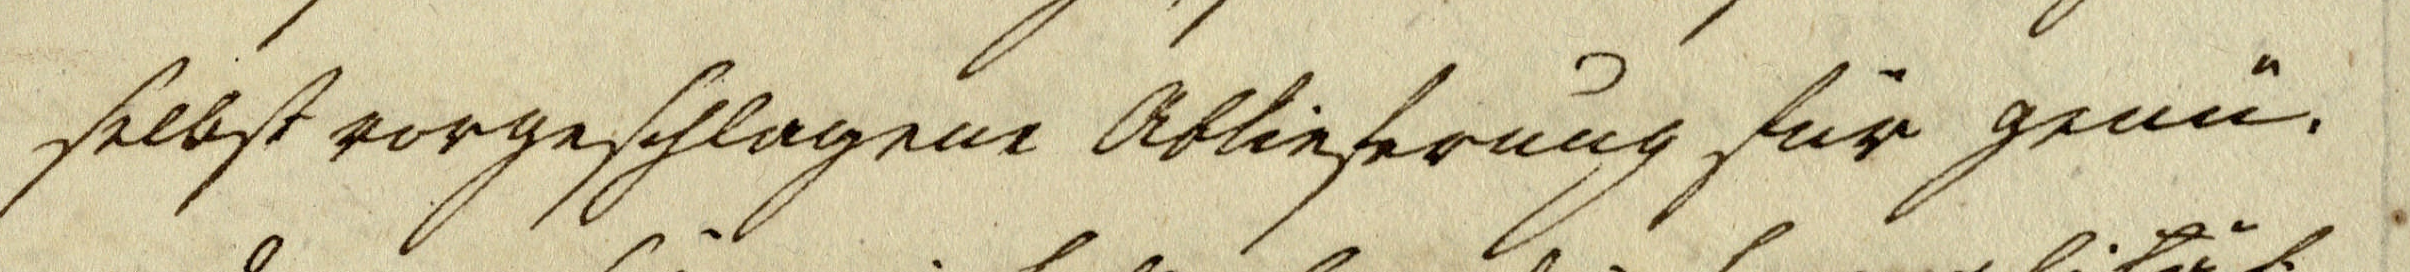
selbst vorgeschlagene Ablieferung für genü¬
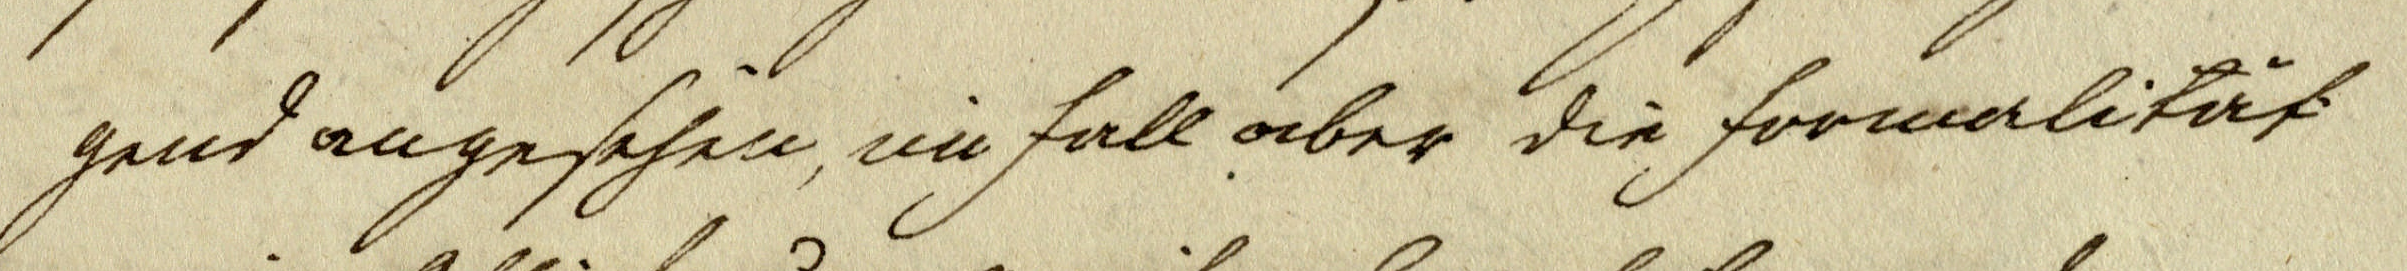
gend angesehen, im Fall aber die Formalität
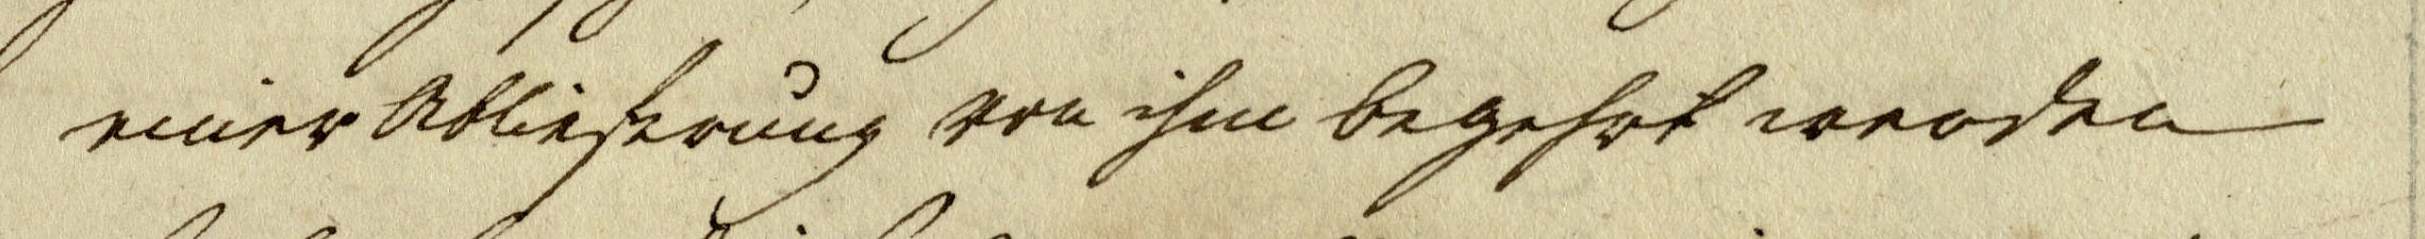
einer Ablieferung von ihm begehrt werden
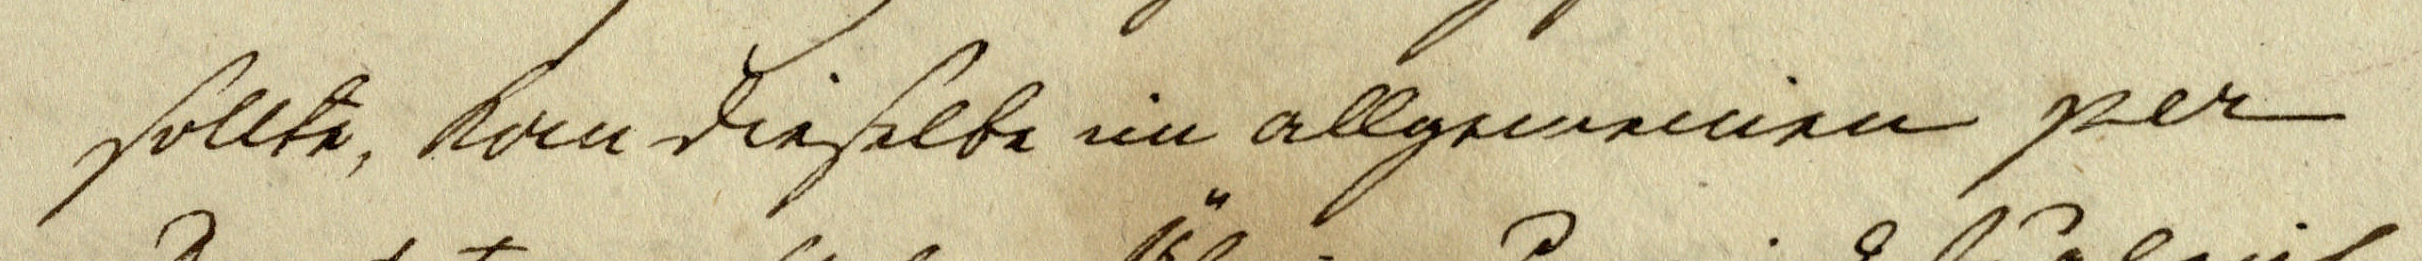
sollte, kan dieselbe im allgemeinen per
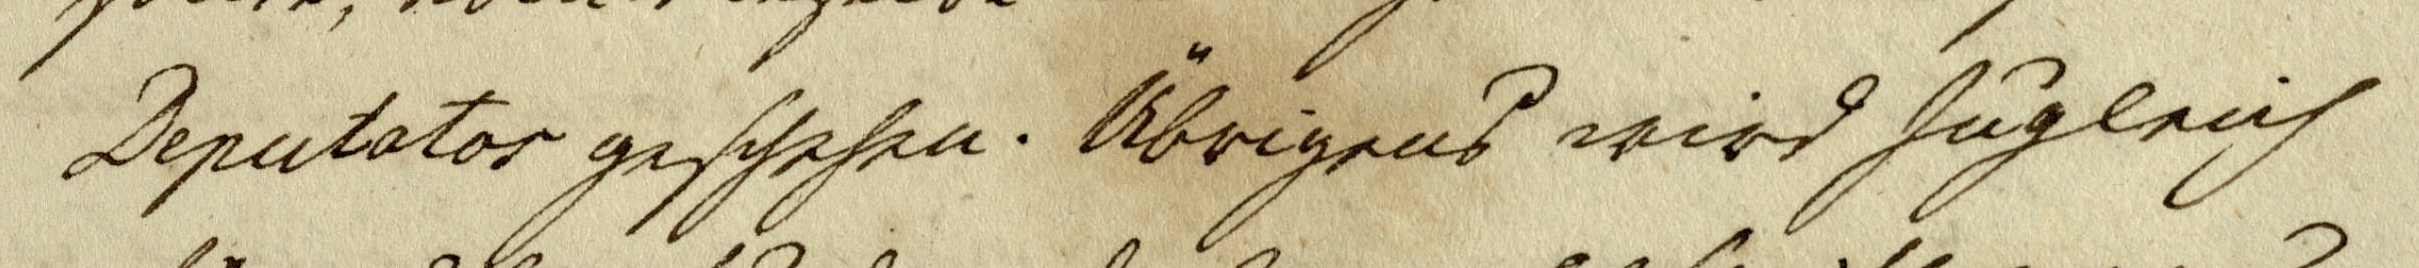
Deputatos geschehen. Übrigens wird zugleich
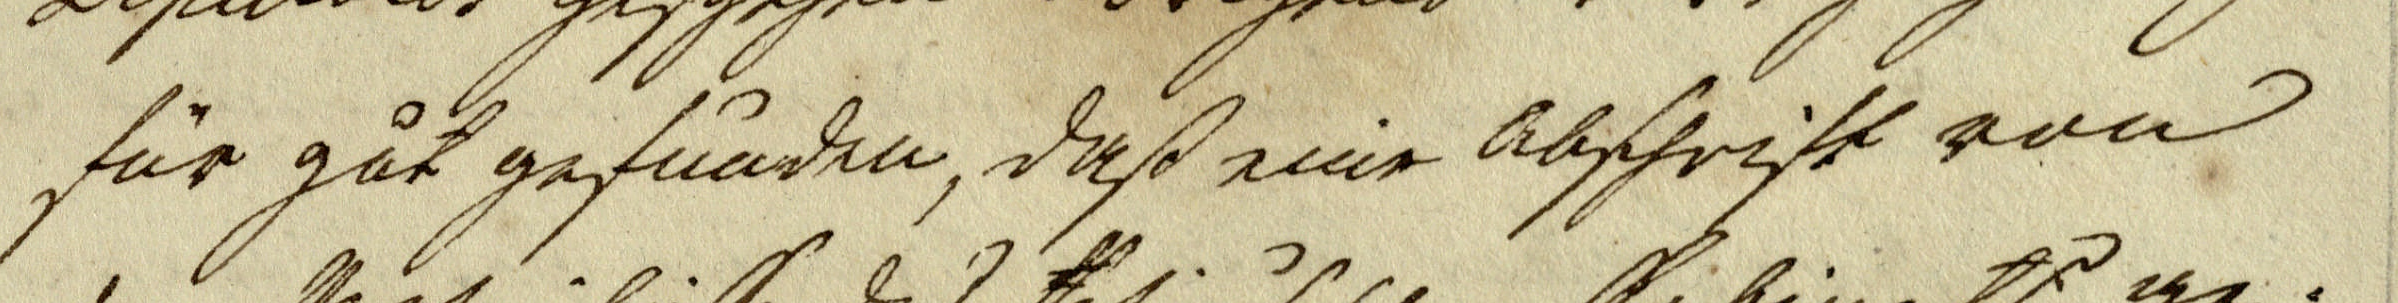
für gut gefunden, daß eine Abschrift von
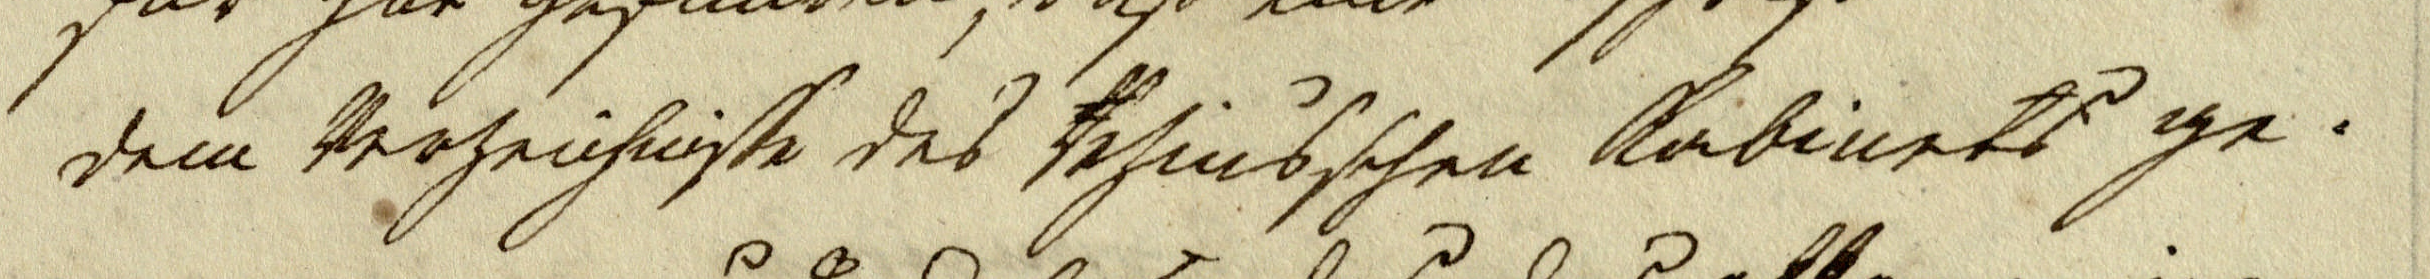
dem Verzeichnisse des Reziusschen Kabinets ge¬
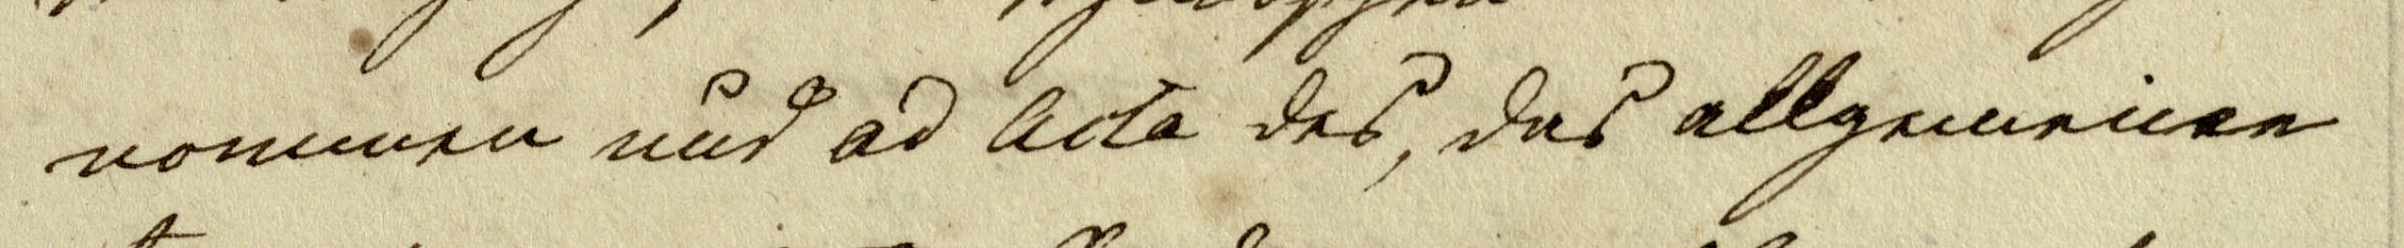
nommen und ad Acta des, das allgemeine
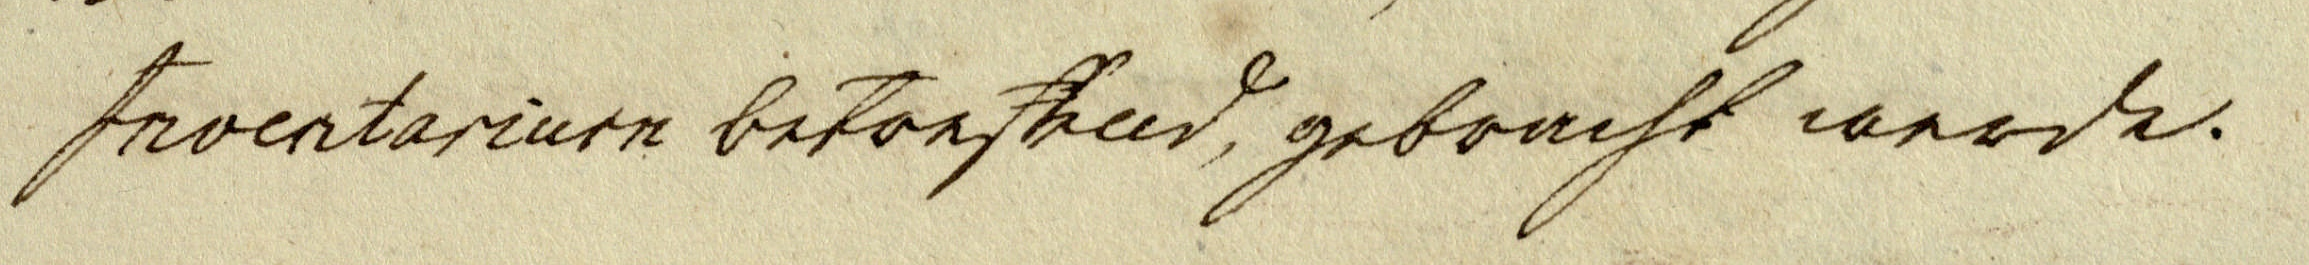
Inventarium betreffend, gebracht werde.
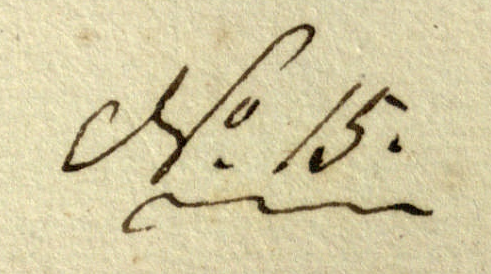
No 15.
